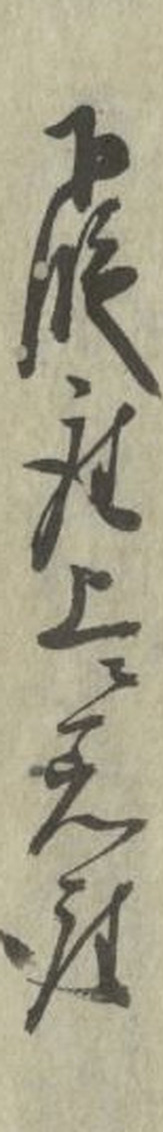下段座上に着座
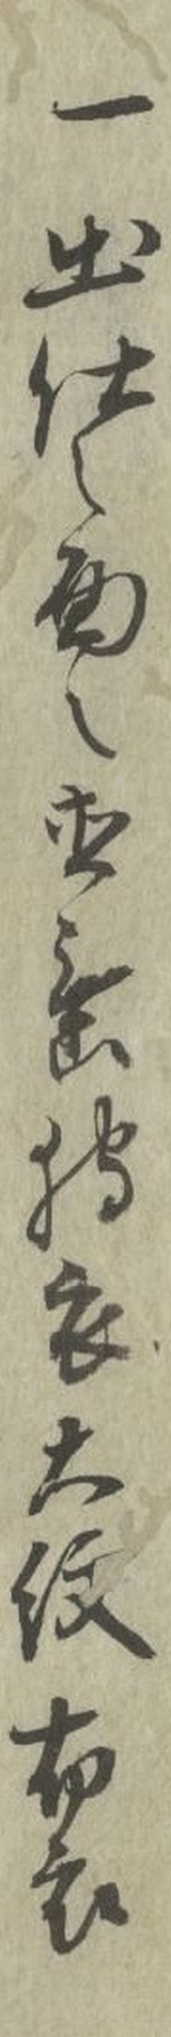一出仕之面之直垂狩衣大紋布衣

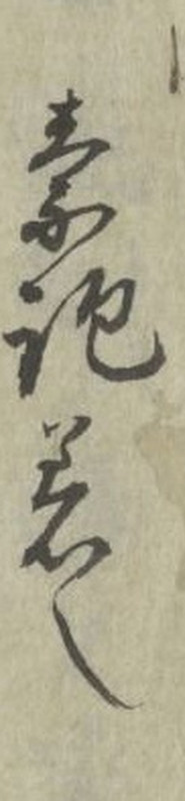素袍着之
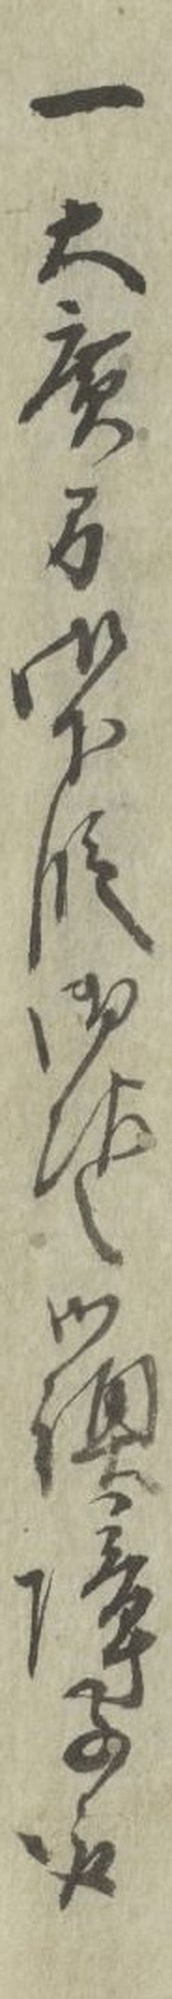一大広間御下段御次之御襖障子取
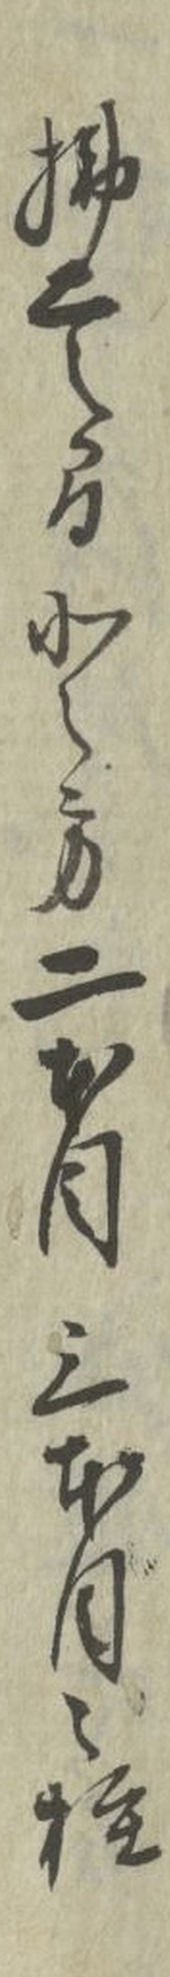払二之間北之方二本目三本目之柱
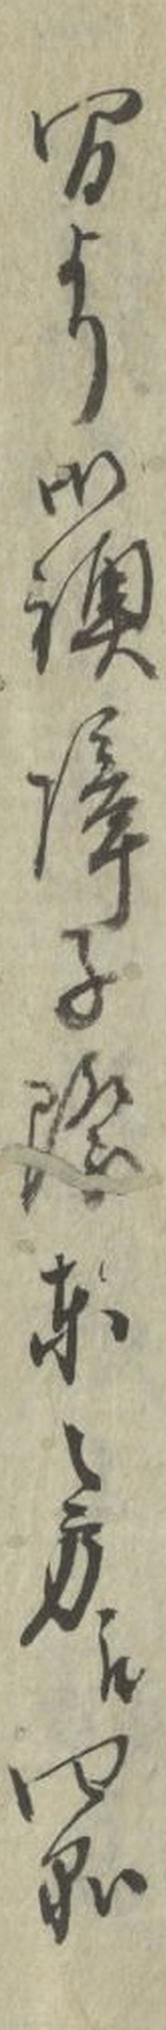間より御襖障子際東之方え四品
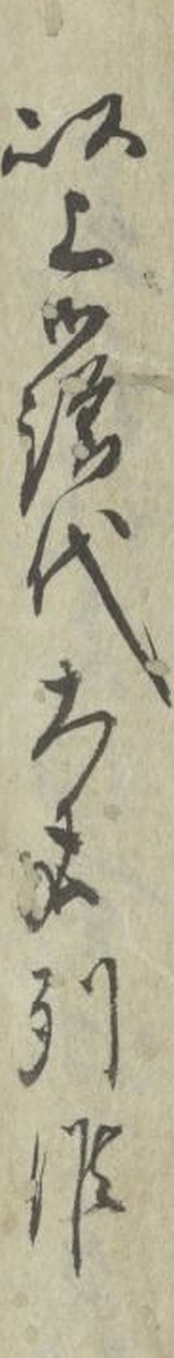以上御譜代大名列候
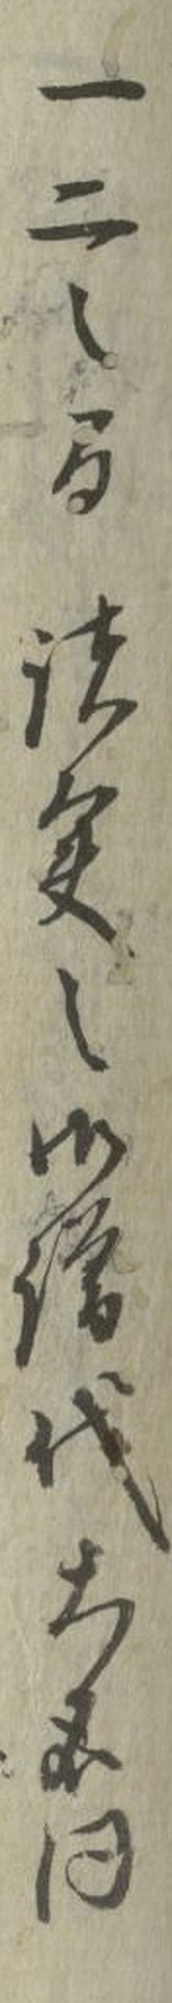一二之間諸大夫之御譜代大名同
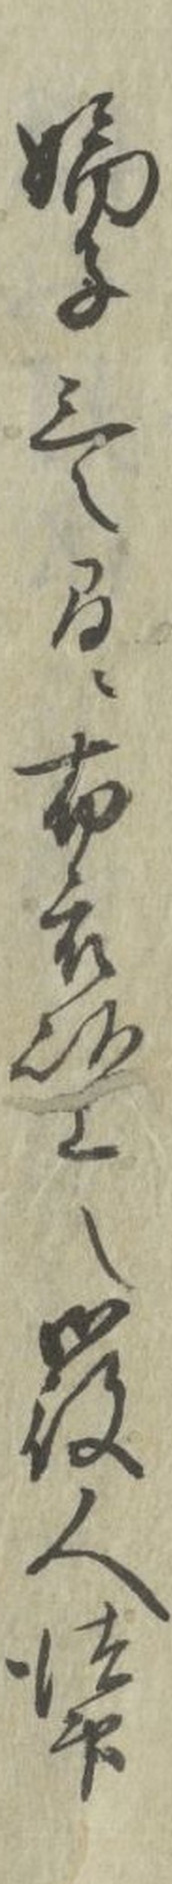嫡子三之間に布衣以上之御役人法印
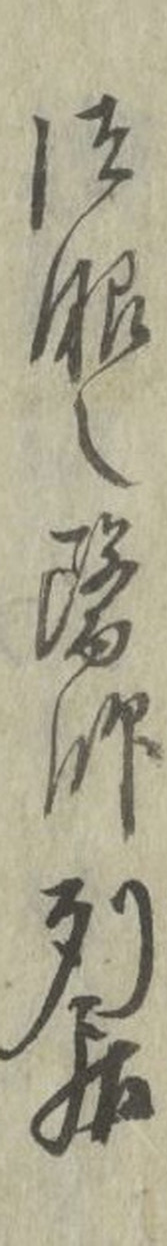法眼之医師列居
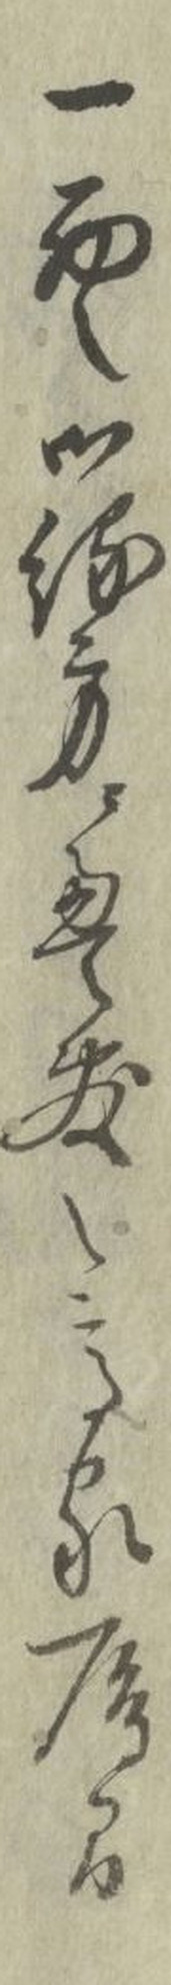一西之御縁方に畳敷之高家雁間
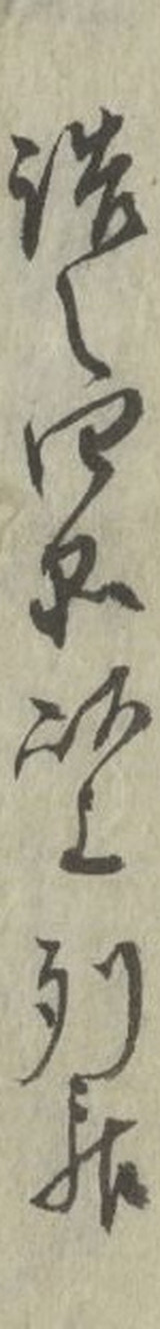詰之四品以上列居

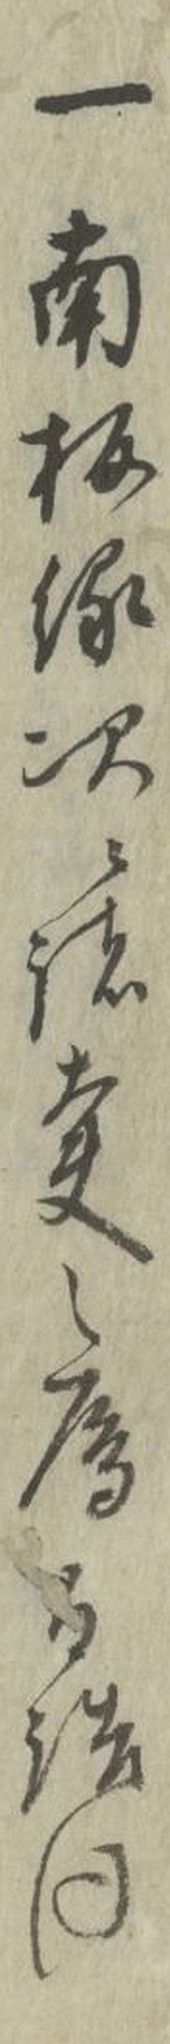一南板縁次に諸大夫之雁間詰同
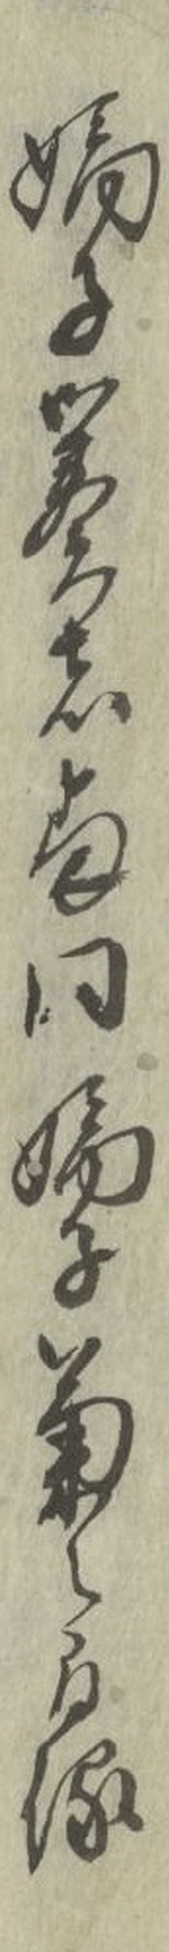嫡子御奏者番同嫡子菊之間縁
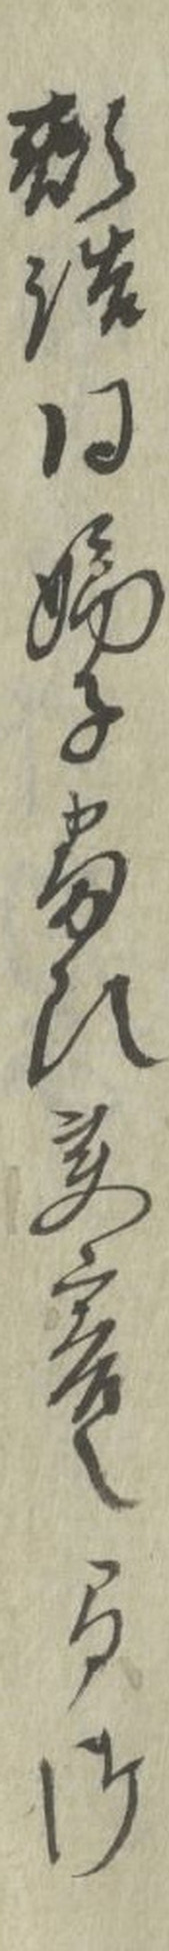頬詰同嫡子番頭芙蓉之間御
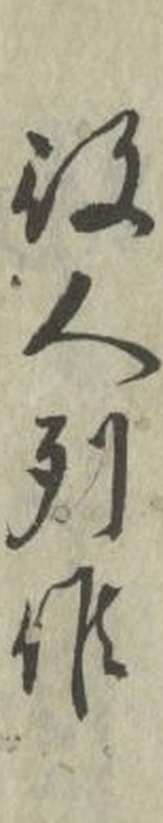役人列候
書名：琉球来朝記 自八至十四終
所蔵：University of the Ryukyus Library
